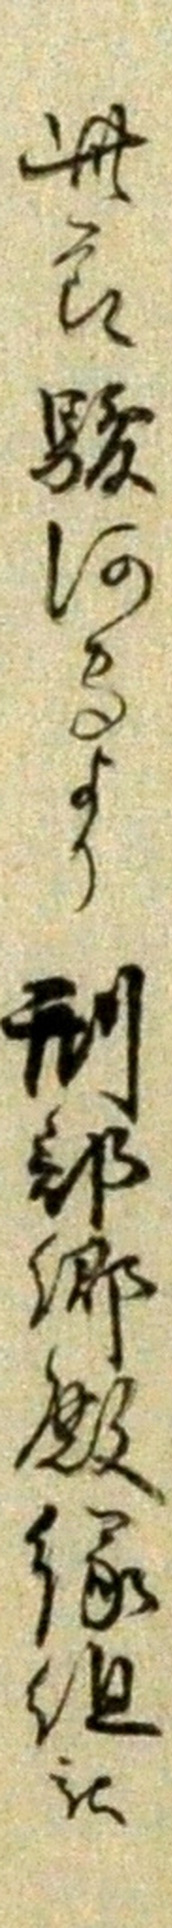此節駿河守より刑部卿殿縁組被
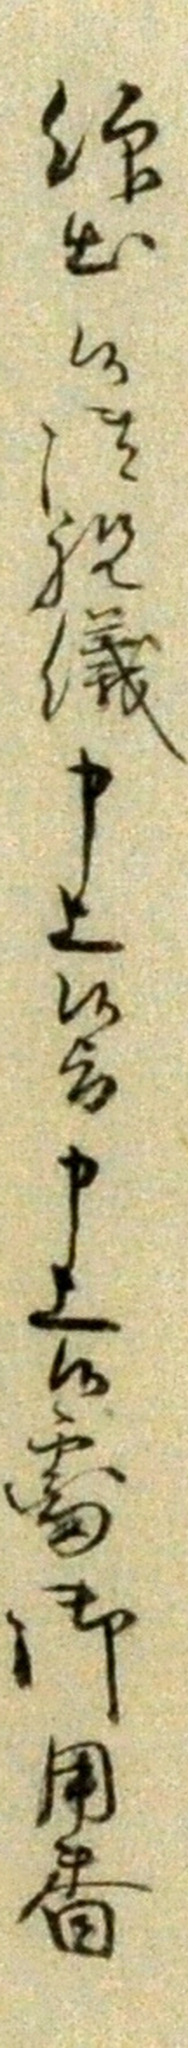仰出候御祝儀申上候旨申上候処御用番
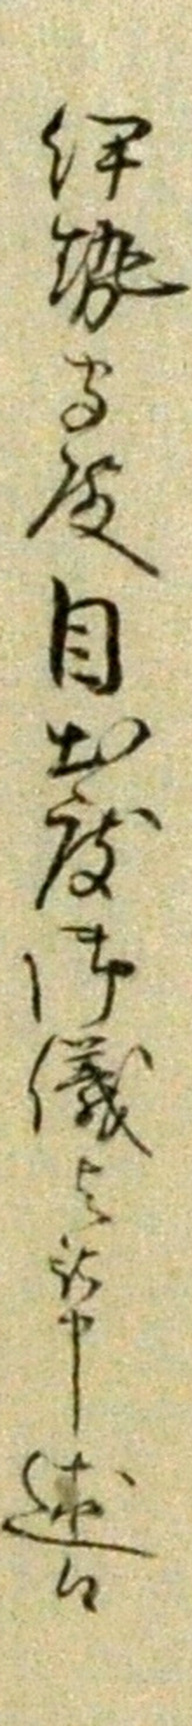伊勢守殿目出度御儀と被申述候
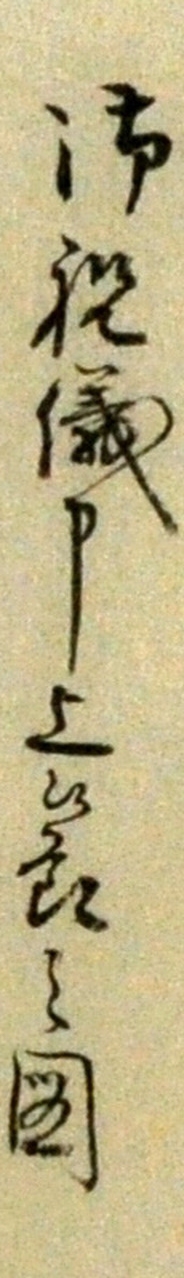御祝儀申上候節之図
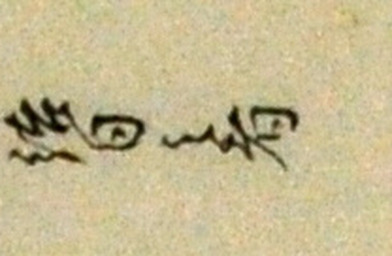詰日之者
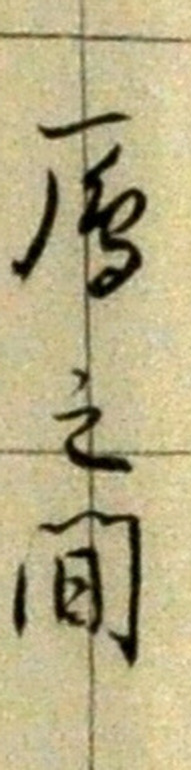菊之間

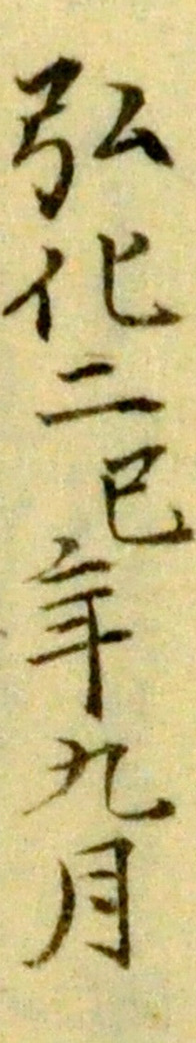弘化二巳年九月
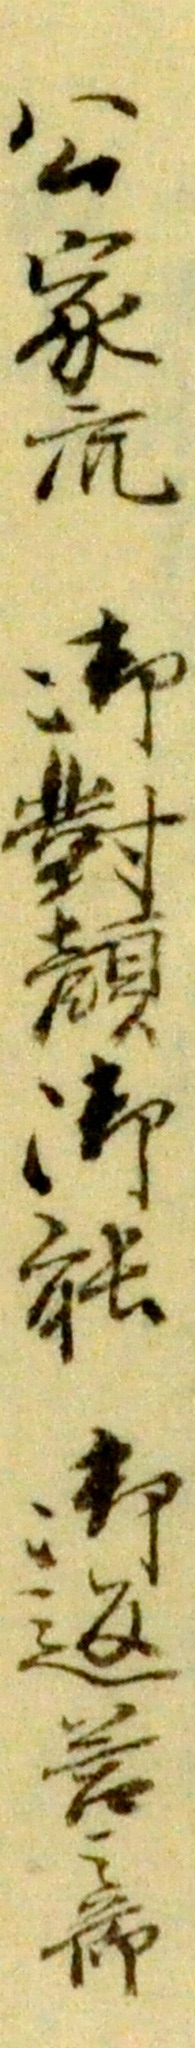公家衆御対顔御能御返答之節
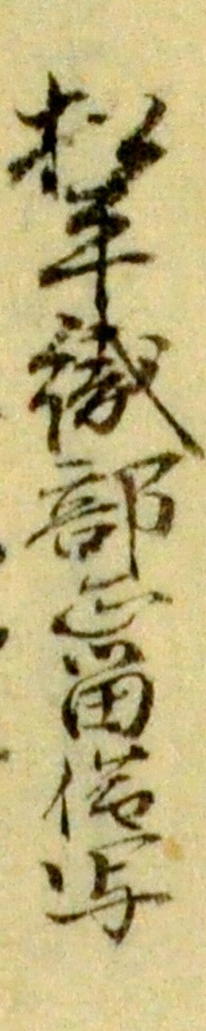松平織部正留借写
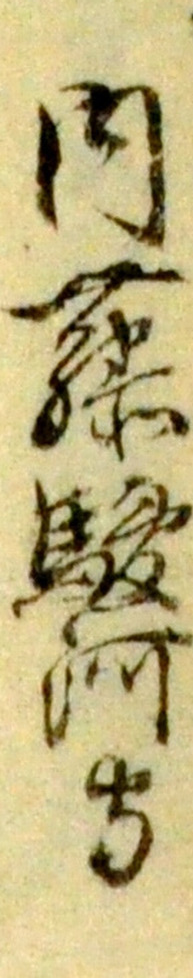内藤駿河守

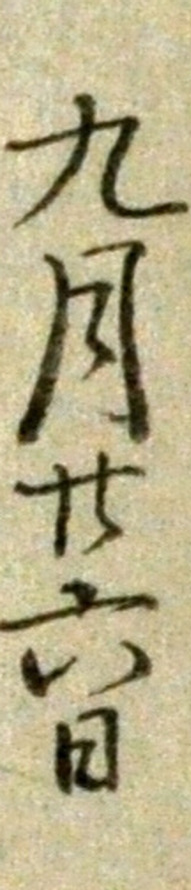九月廿六日
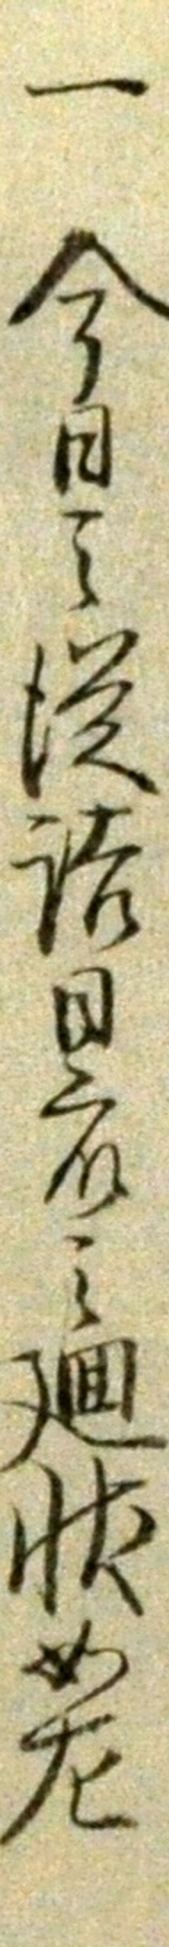一今日之従詰日衆之廻状如左
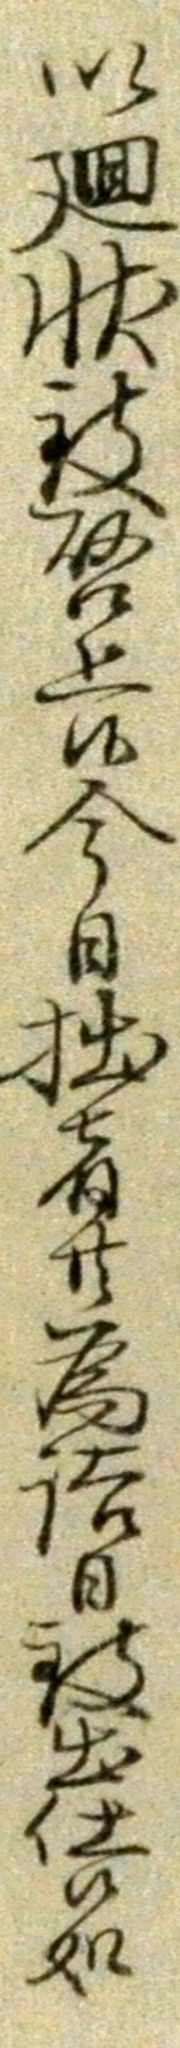以廻状致啓上候今日拙者共為詰日致出仕候処
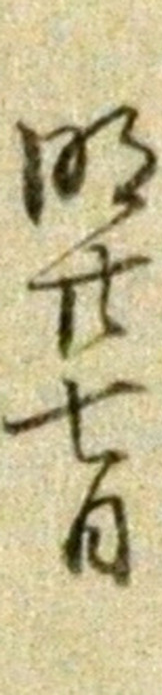明廿七日
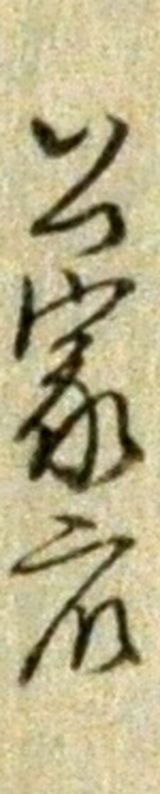公家衆
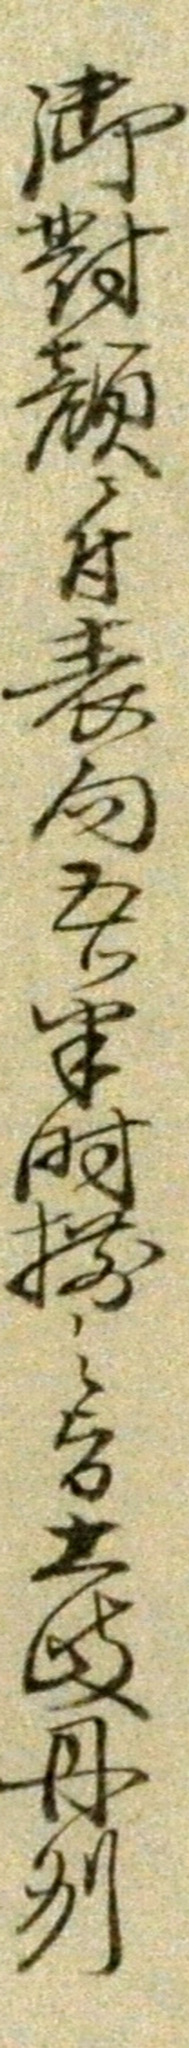御対顔ニ付表向五ツ半時揃之旨土岐丹州
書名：諸留書〔一括〕
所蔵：伊那市立高遠町図書館・合同会社AMANE
